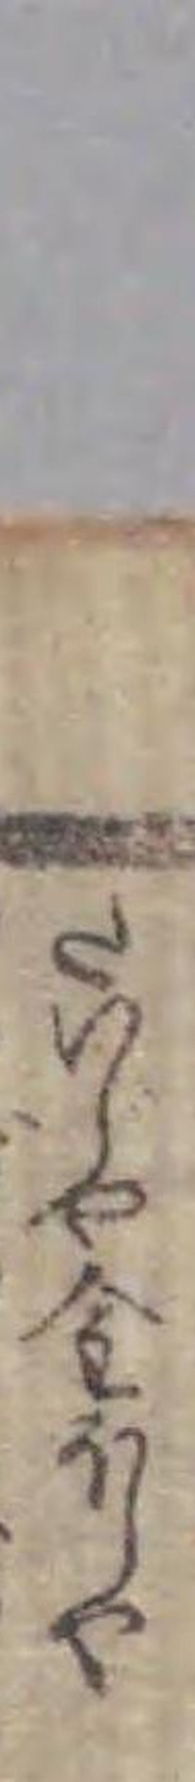たいしや金ほしや
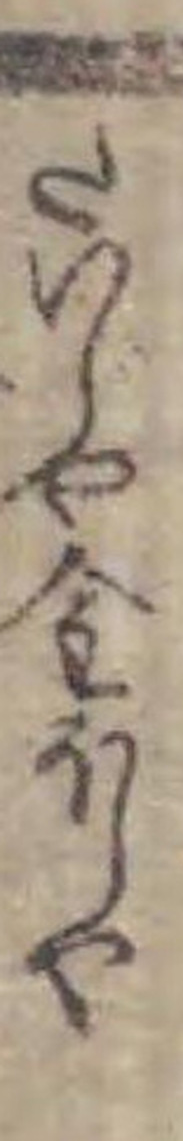たいしや金ほしや
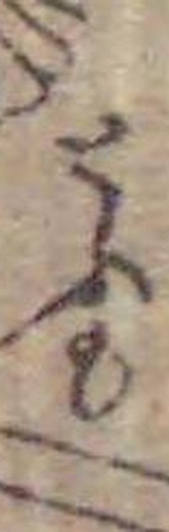とふも
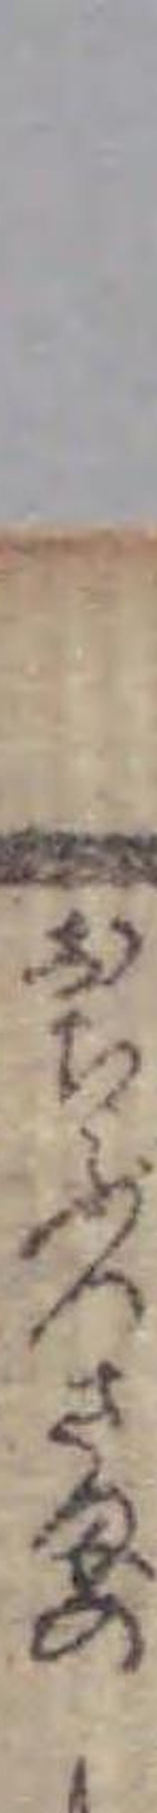おちぶつさまの
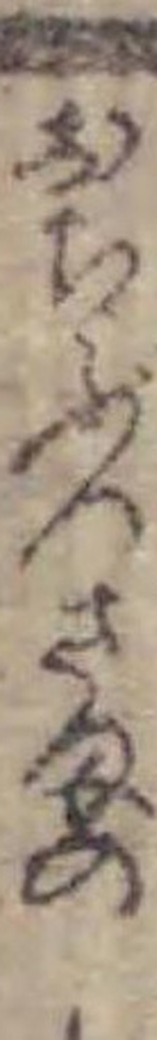おちぶつさまの
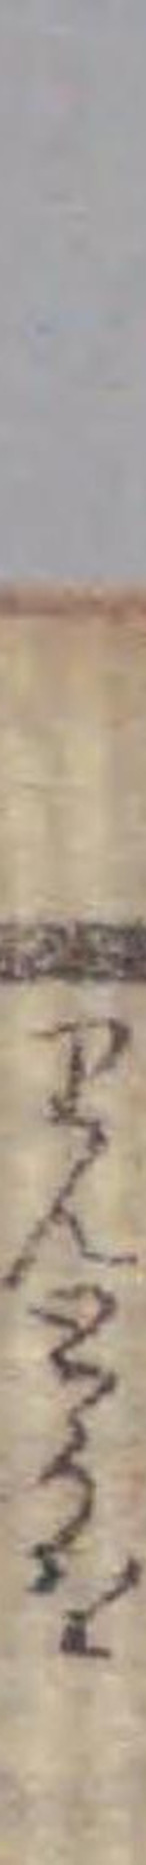りんとうを
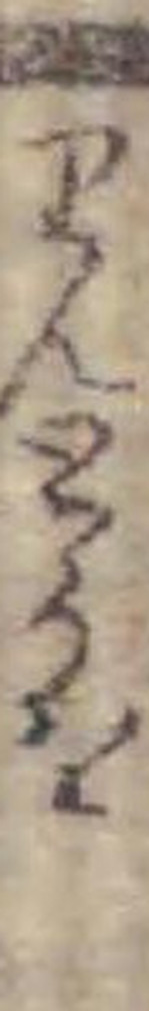りんとうを
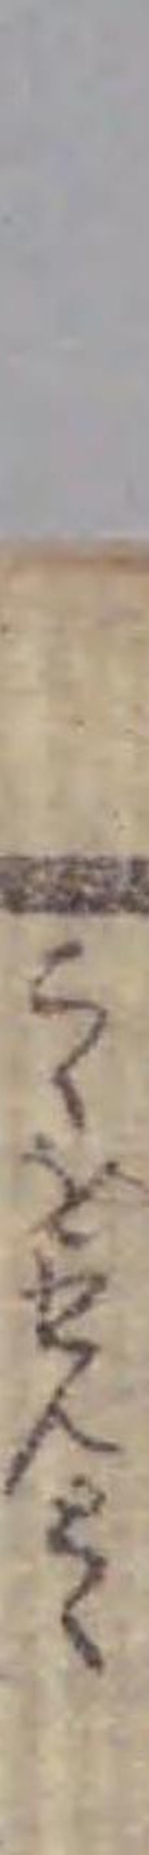こゝをせんとゝ
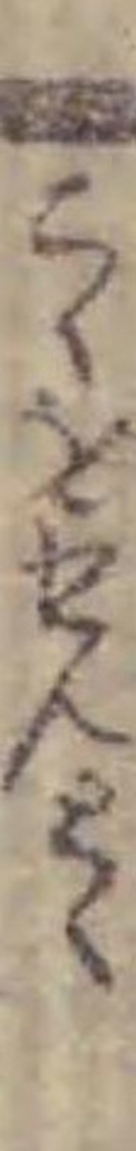こゝをせんとゝ
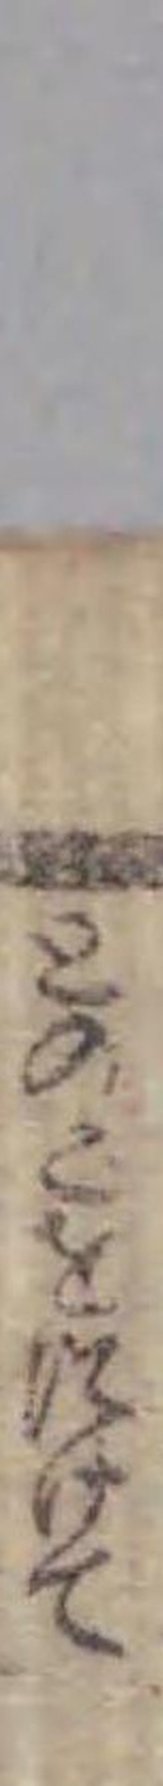とのこをにけて
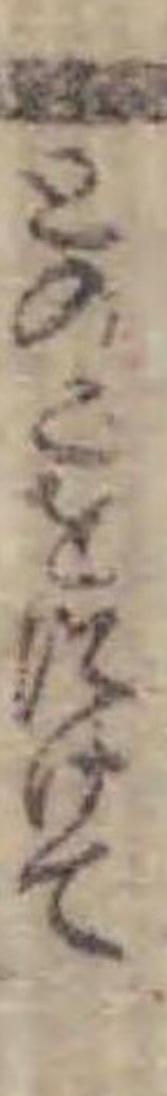とのこをにけて
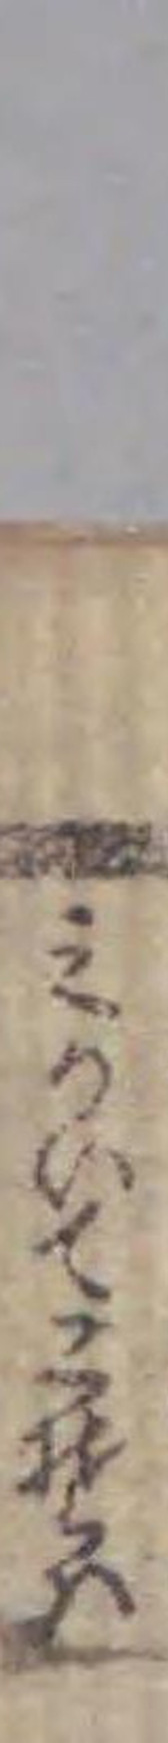みかいてこそは
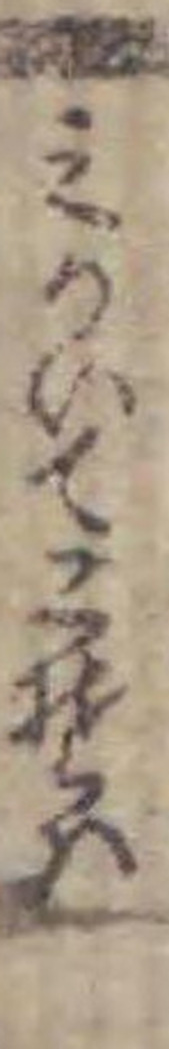みかいてこそは
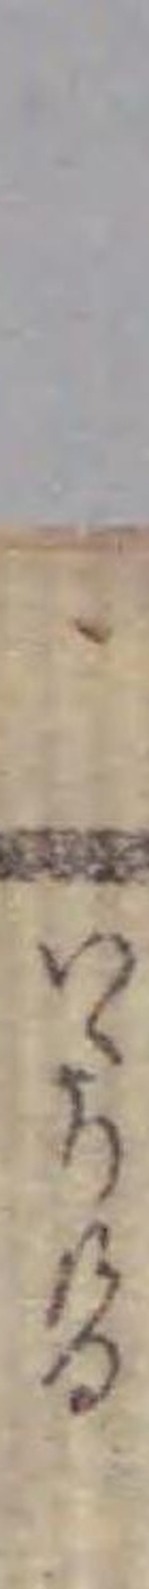いゝにける
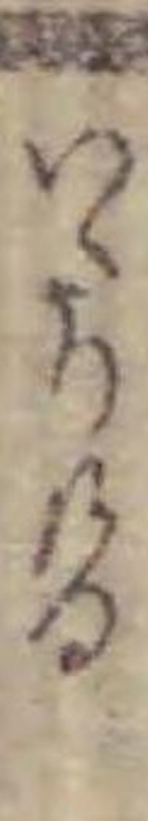いゝにける
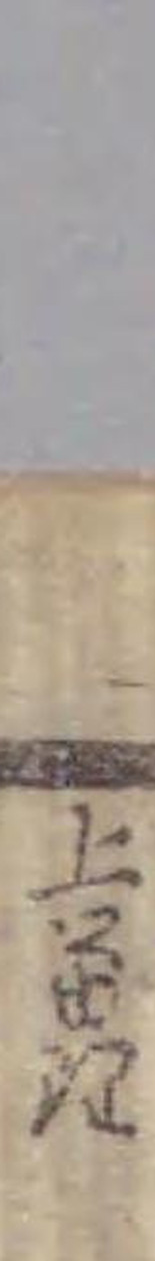上留理
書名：年寄之冷水曽我 : 3巻
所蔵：国立国会図書館 National Diet Library, JAPAN
